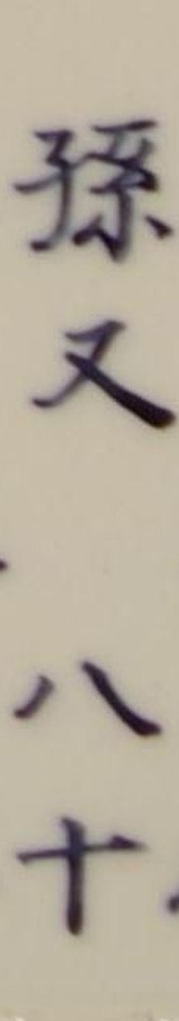孫又八十
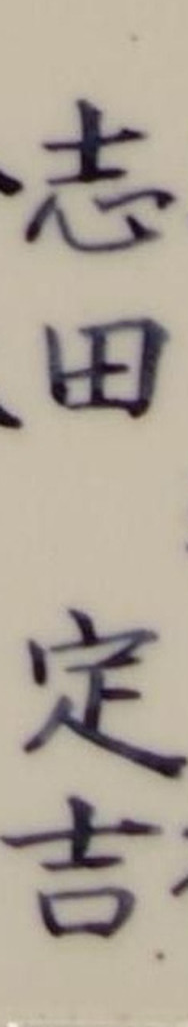志田定吉
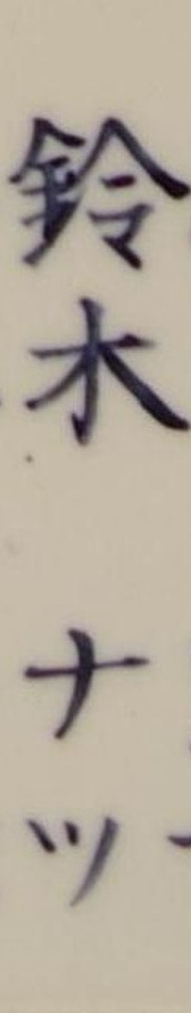鈴木ナツ
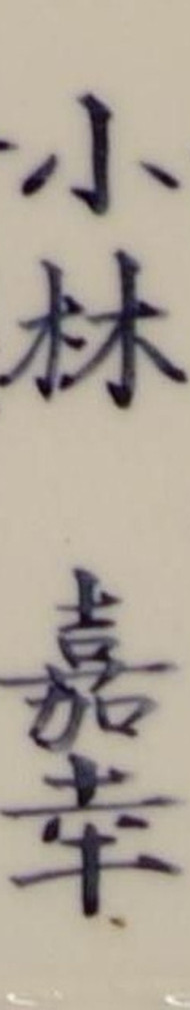小林嘉幸
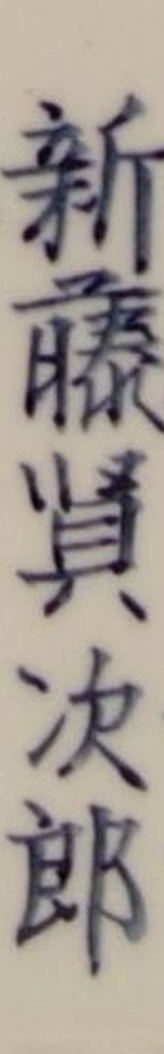新藤賢次郎
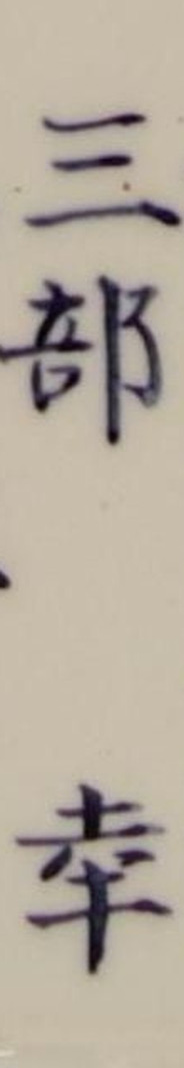三部幸
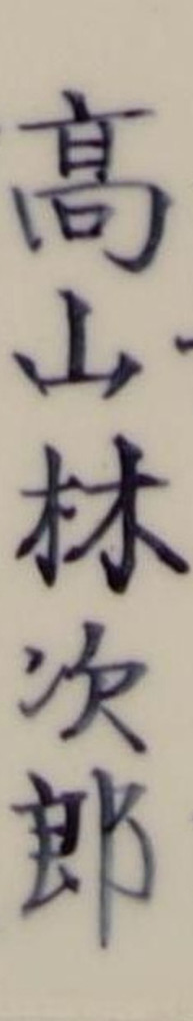高山林次郎
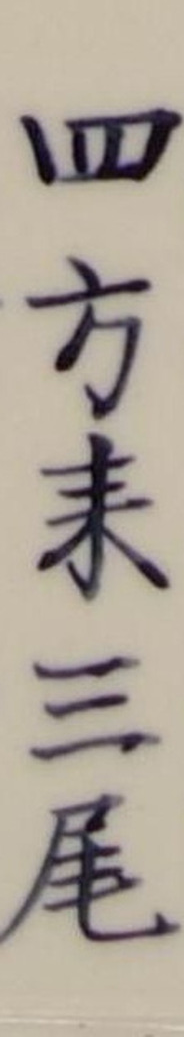四方耒三尾
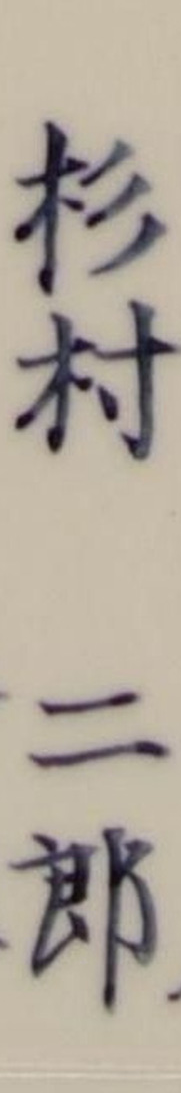杉村二郎
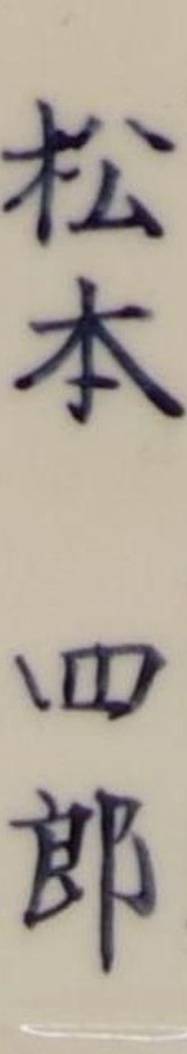松本四郎
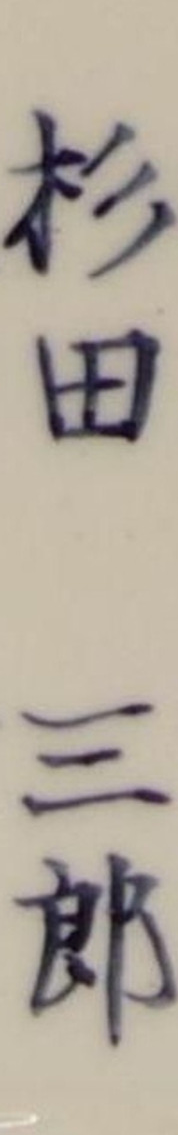杉田三郎
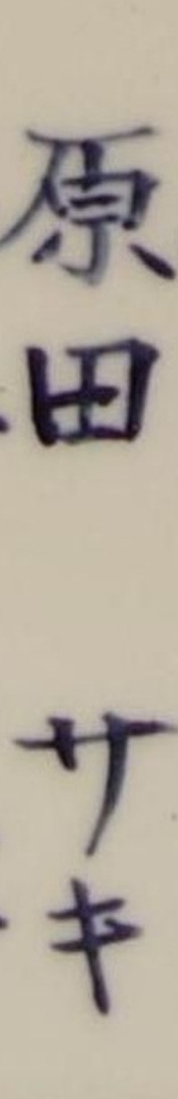原田サキ
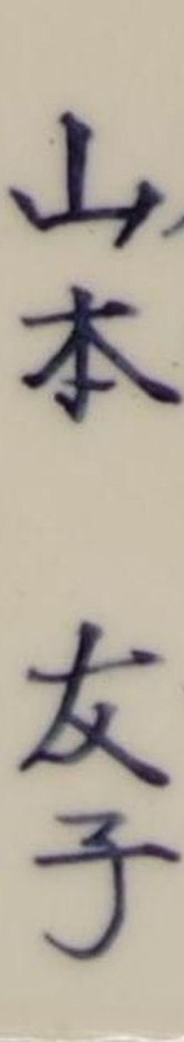山本友子
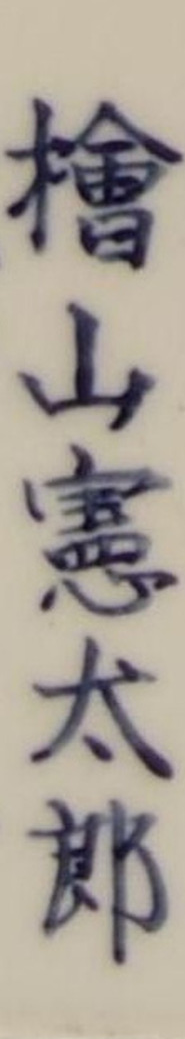檜山憲太郎
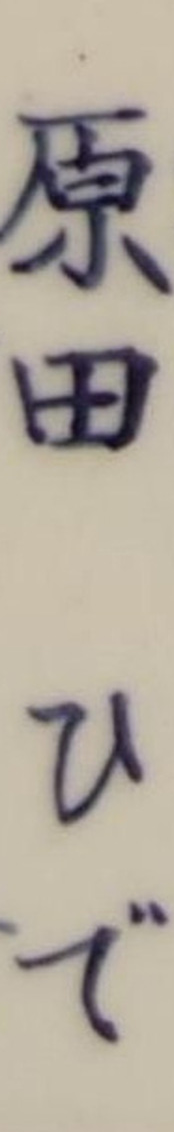原田ひで
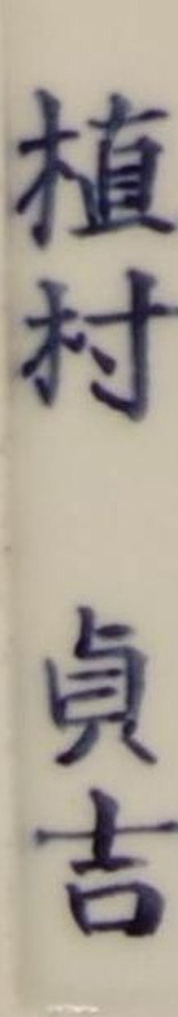植村貞吉
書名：E~L
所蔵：高野山金剛峯寺
